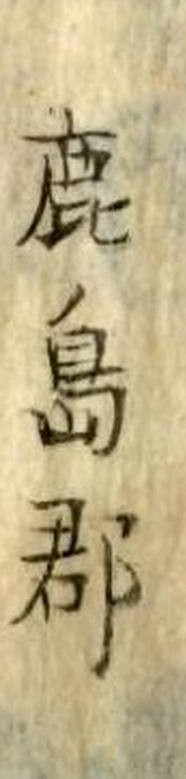鹿島郡
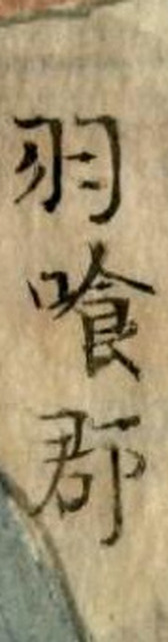羽喰郡

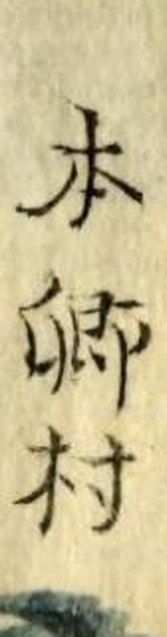本卿村
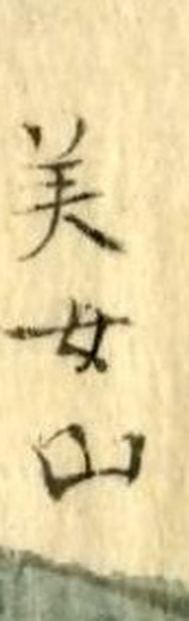美女山
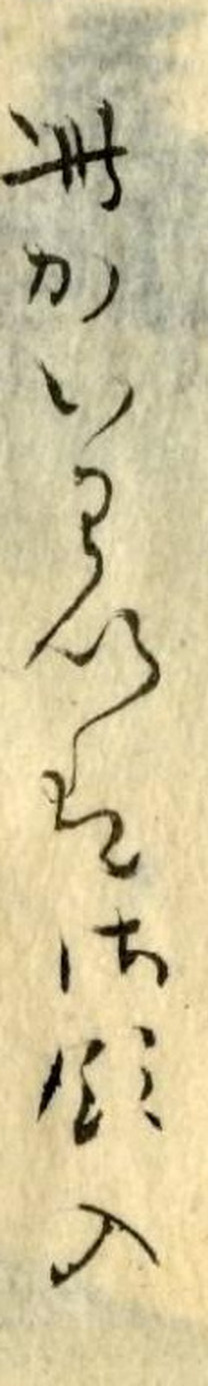此かいわいは御領入
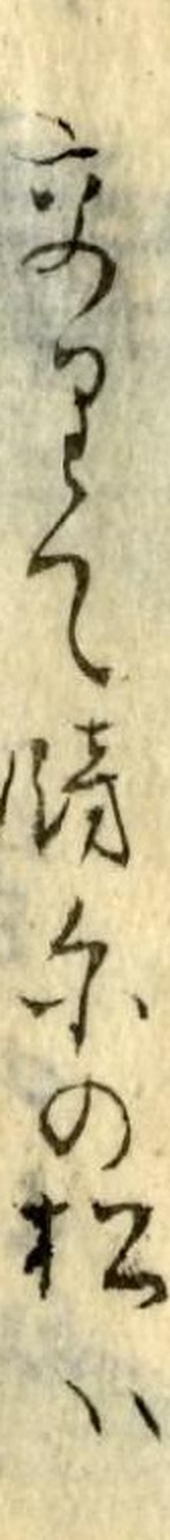交りて牓示の松は
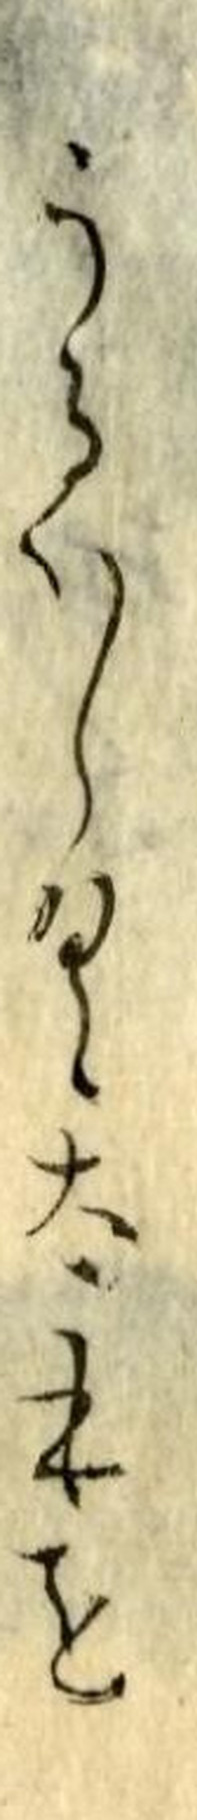うるはしく太木を
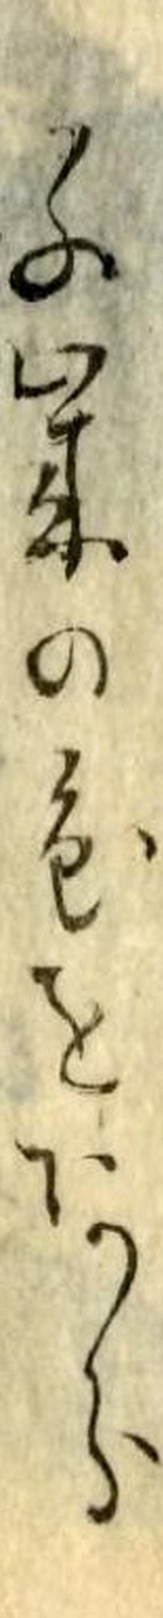千歳の色をあら
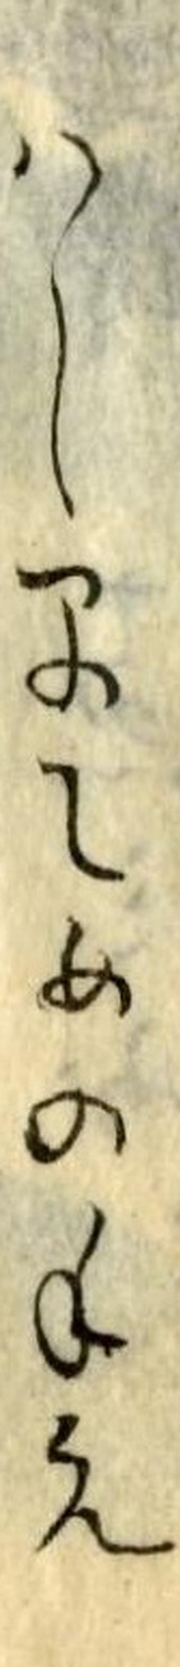はし早乙女の手元
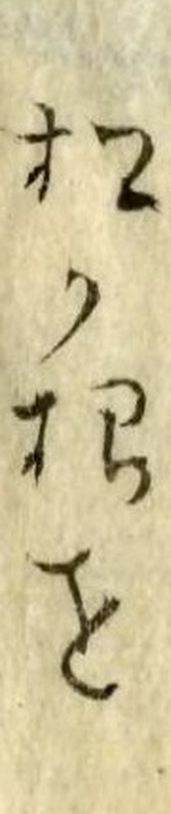松か根を
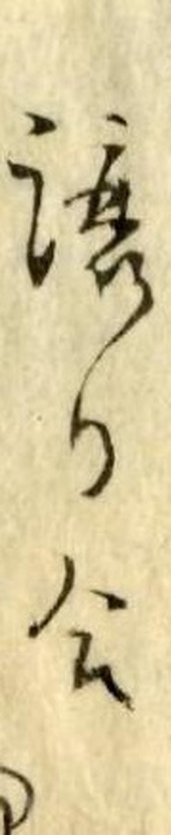譲り合
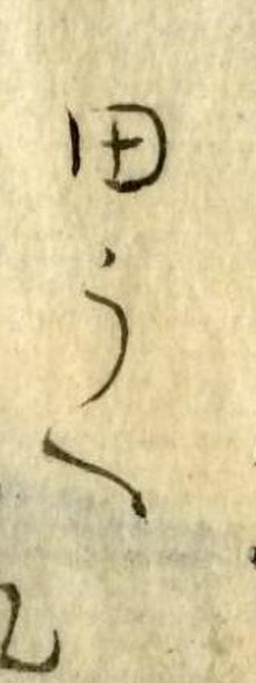田うへ

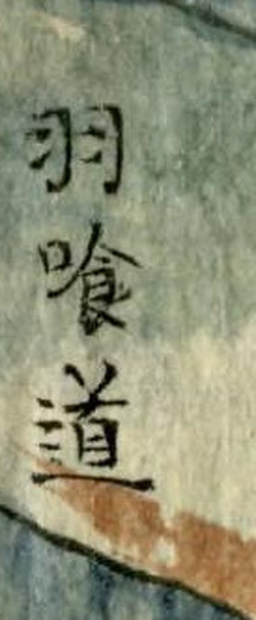羽喰道
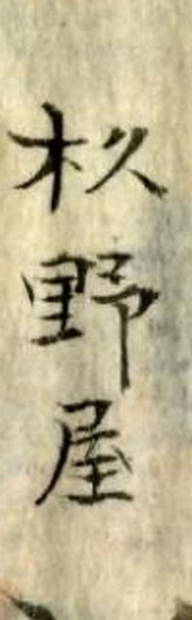杦野屋
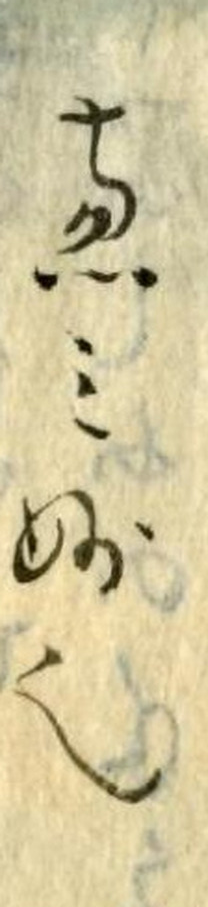恵み妙也
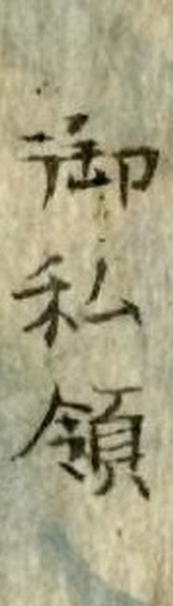御私領
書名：能登めぐり
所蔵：Ishikawa Prefectural Library
